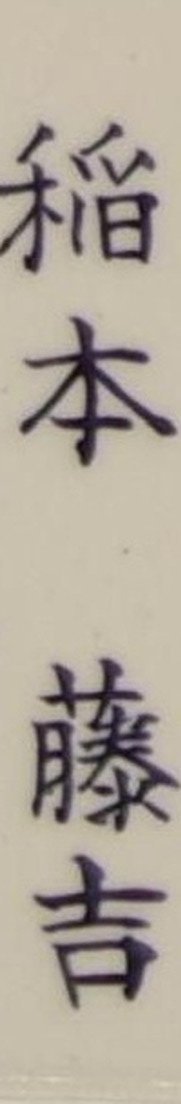稲本藤吉

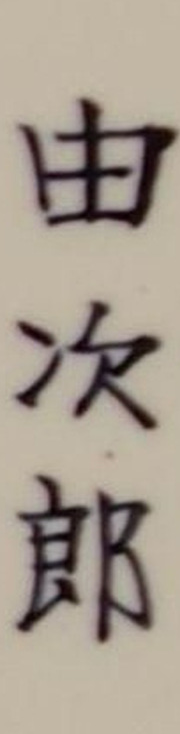由次郎
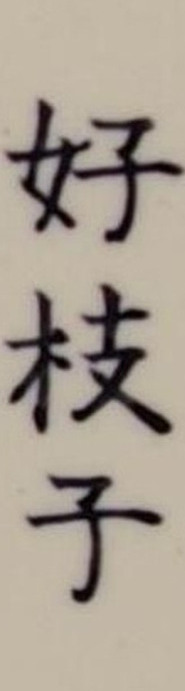好枝子
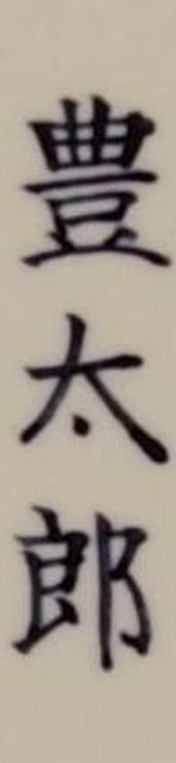豊太郎
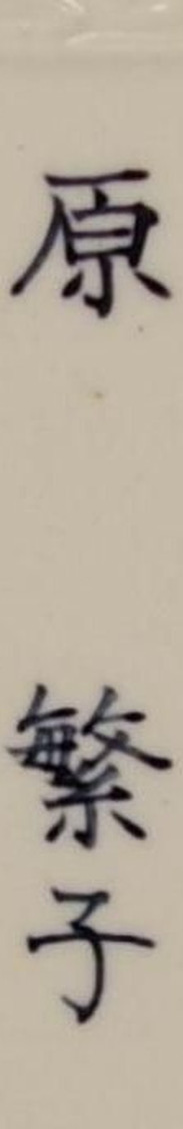原繁子
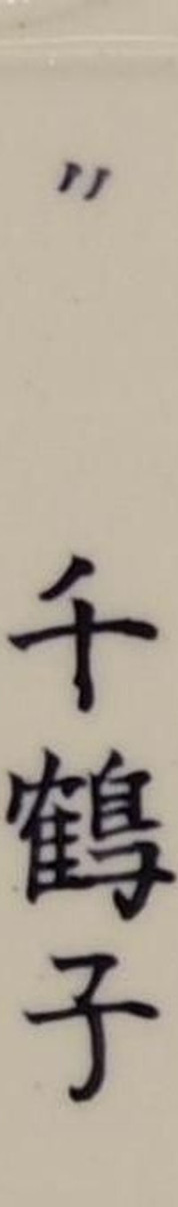千鶴子
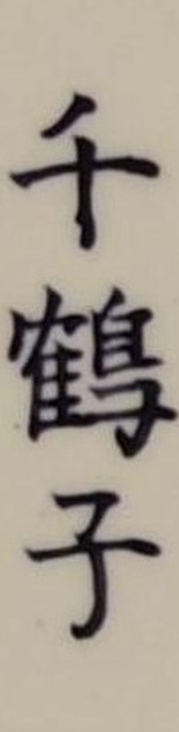千鶴子
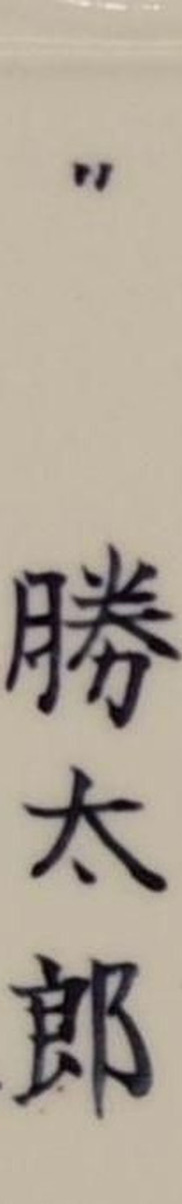勝太郎
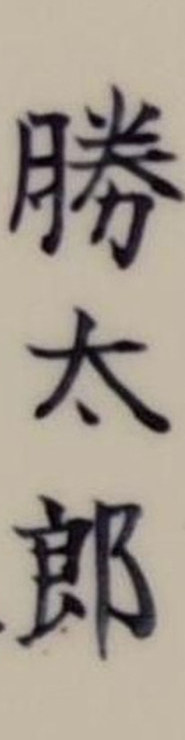勝太郎

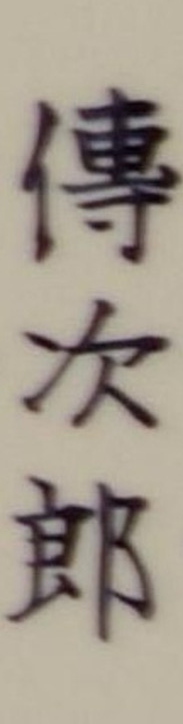伝次郎
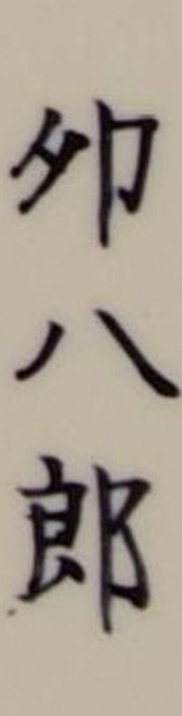卯八郎

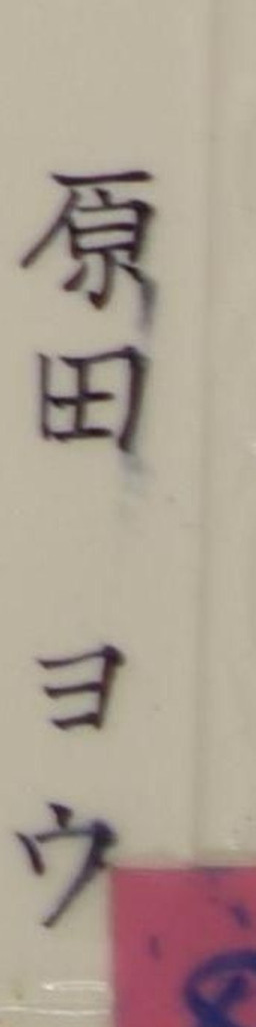原田ヨウ
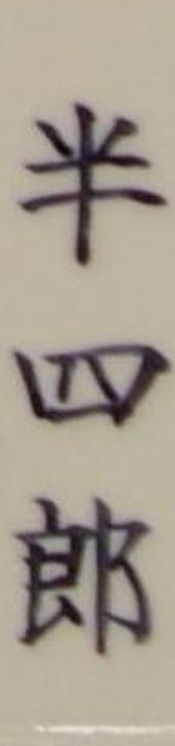半四郎
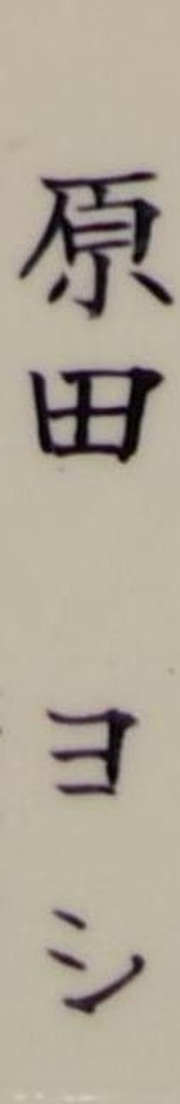原田ヨシ

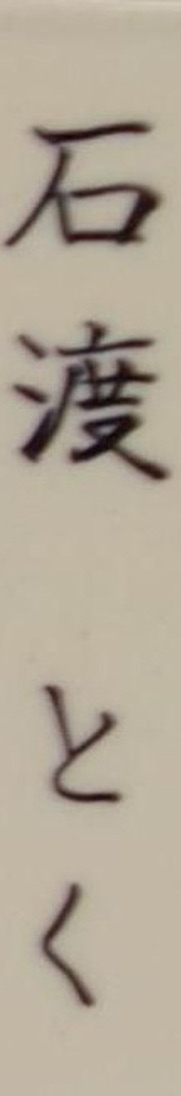石渡とく
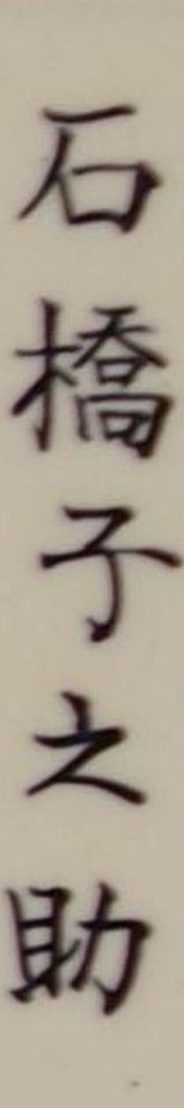石橋子之助
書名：M~S
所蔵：高野山金剛峯寺
